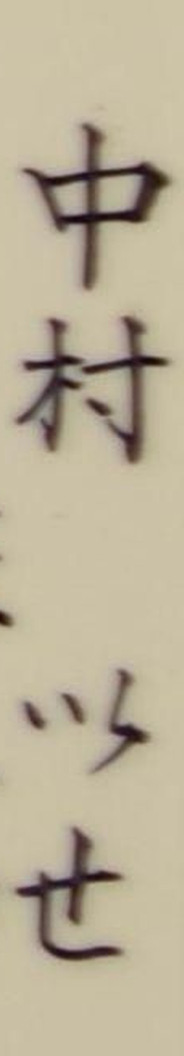中村いせ
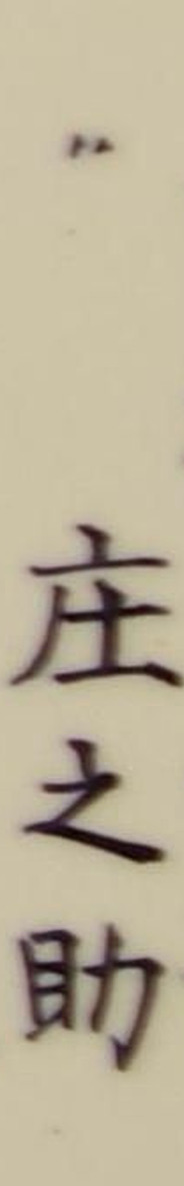庄之助
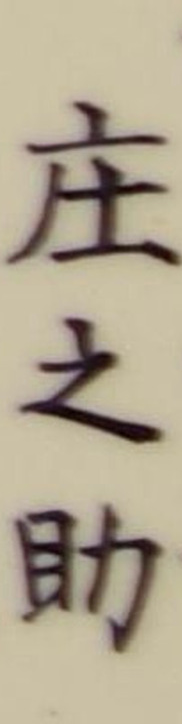庄之助
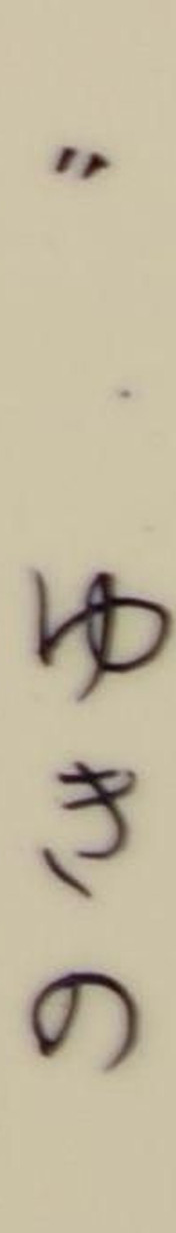ゆきの
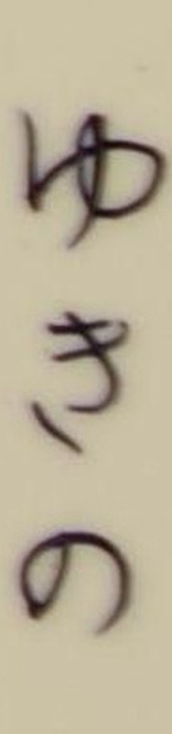ゆきの
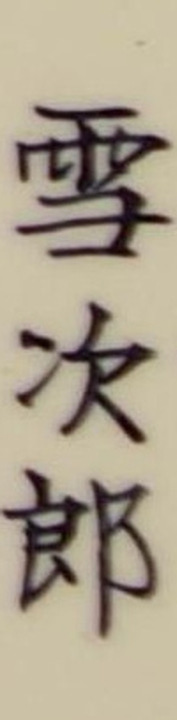雪次郎
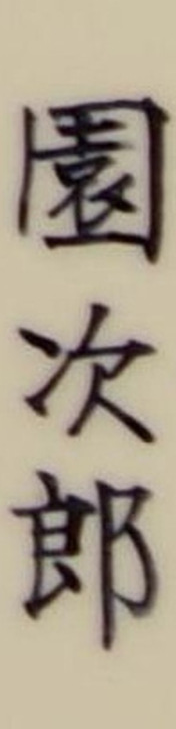雪次郎
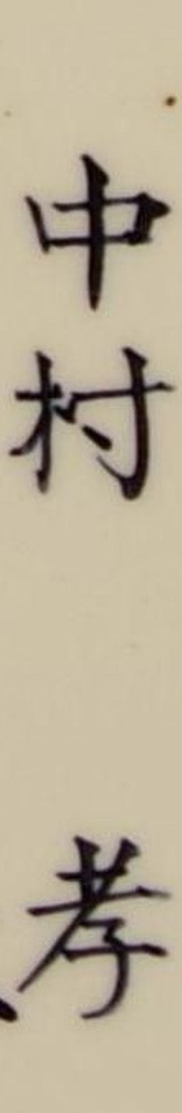中村孝
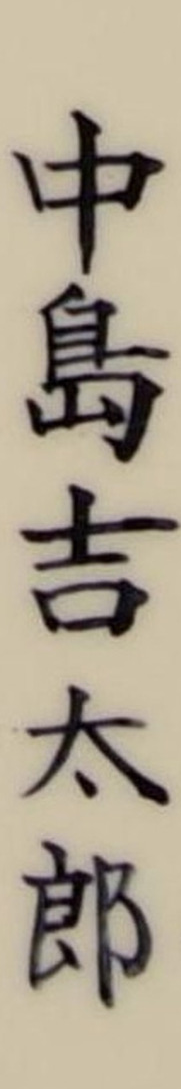中島吉太郎
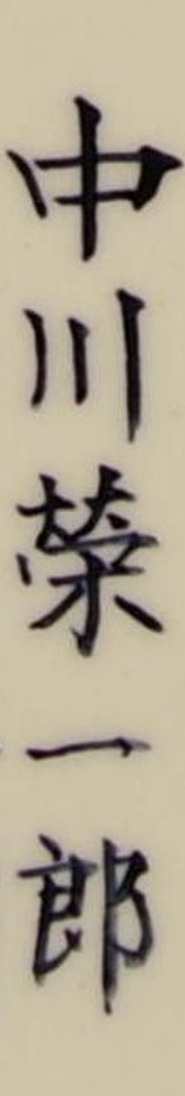中川榮一郎
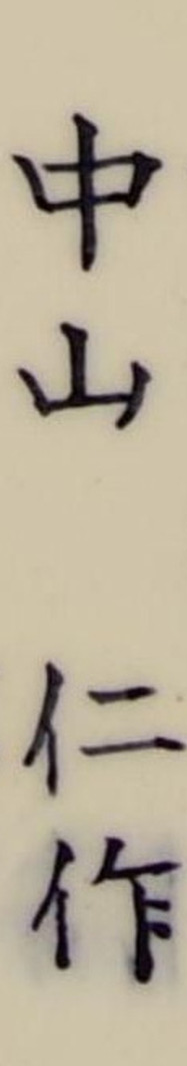中山仁作
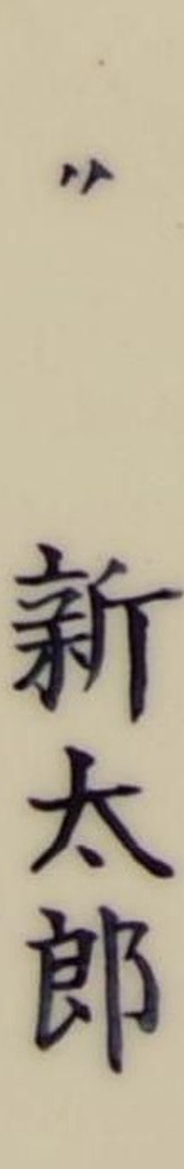新太郎
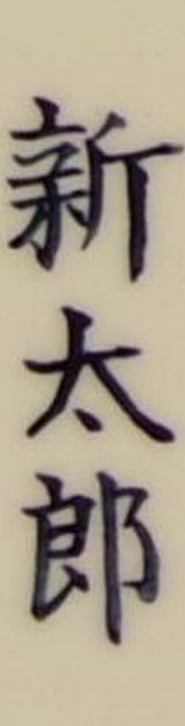新太郎
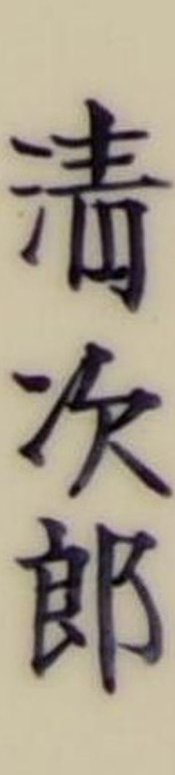清次郎
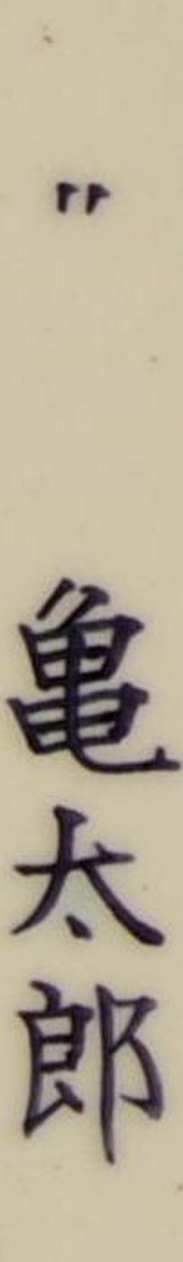亀太郎
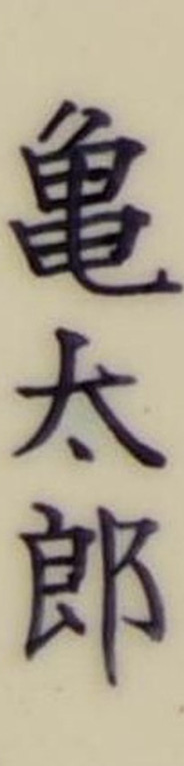亀太郎
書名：E~L
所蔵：高野山金剛峯寺
